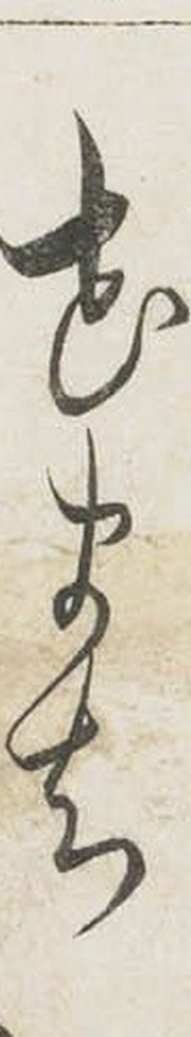花まち
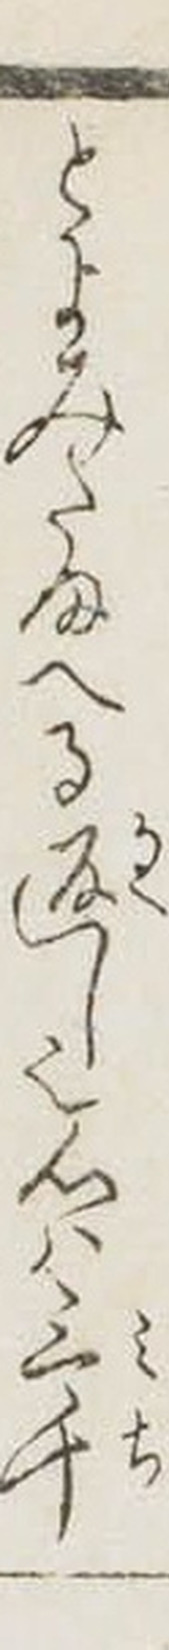とよみたまへる返し也心は三千
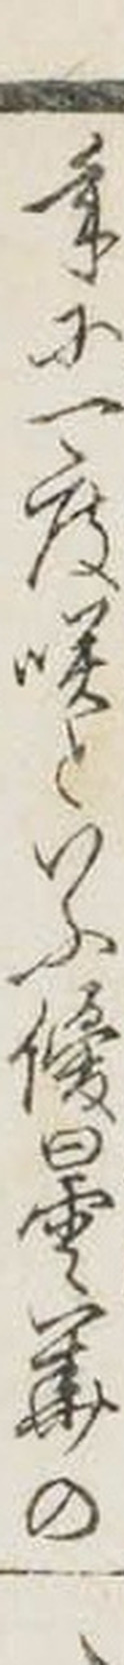年に一度咲といふ優曇華の
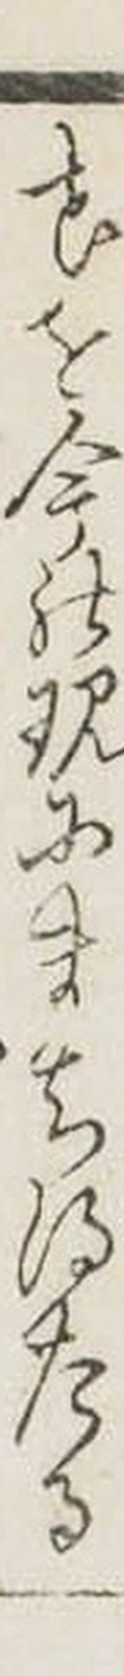花を今の現にまち得たる
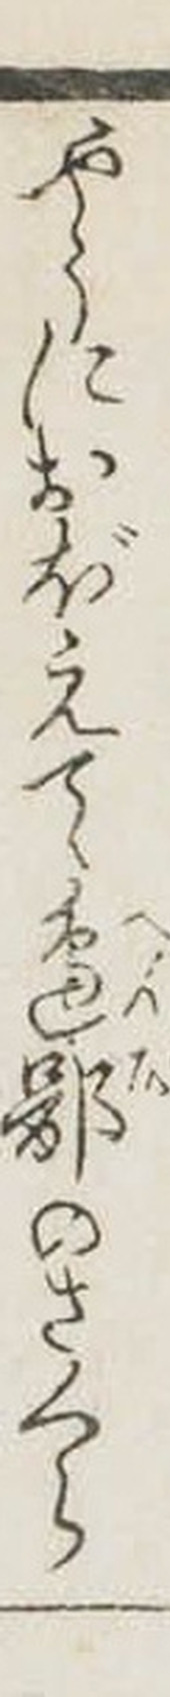やうにおぼえて辺鄙のさくら
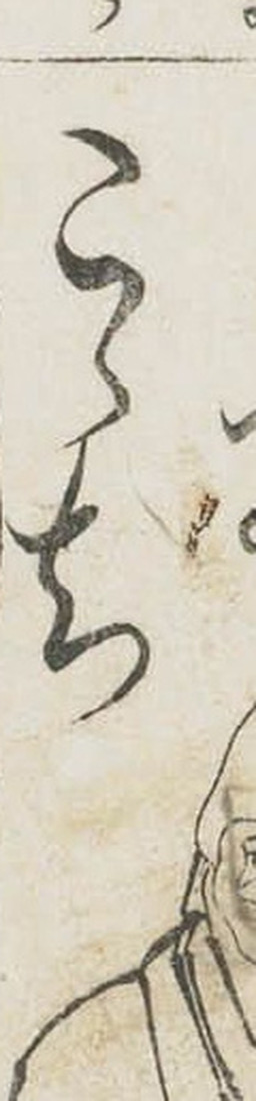こゝち
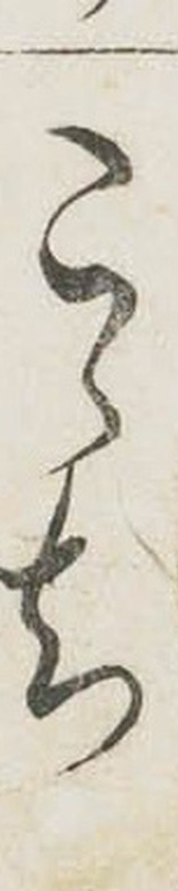こゝち
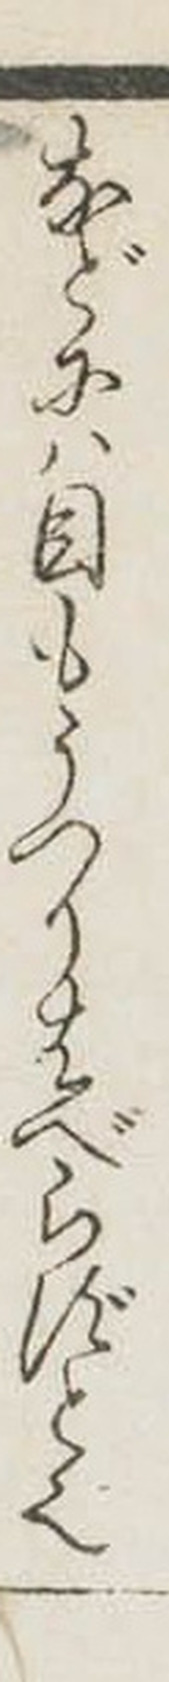などには目もうつりはべらずと也
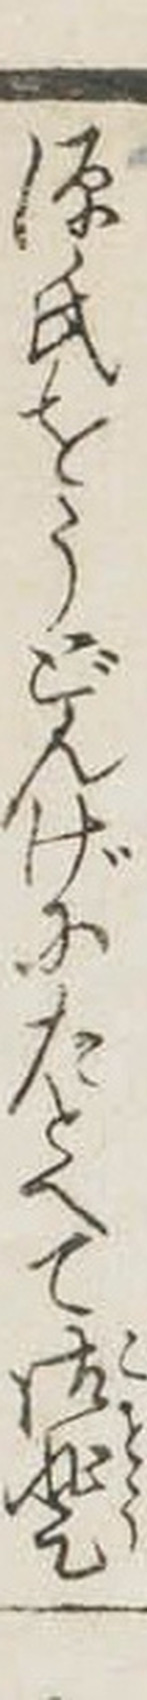源氏をうどんげにたとへて御登
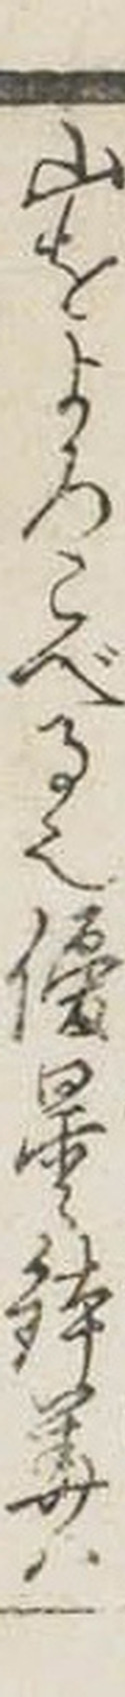山をよろこべる也優曇鉢華は
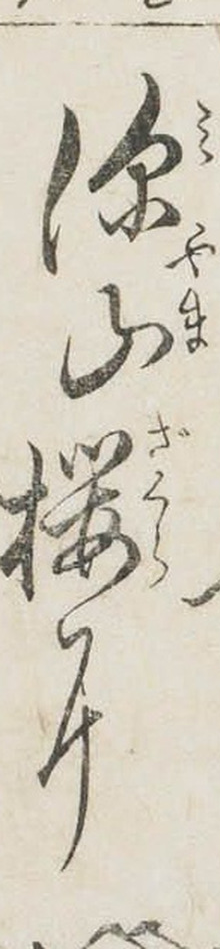深山桜に
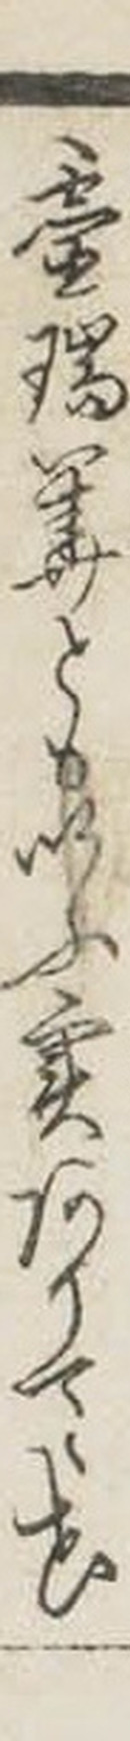霊瑞華ともいふ実ありて花
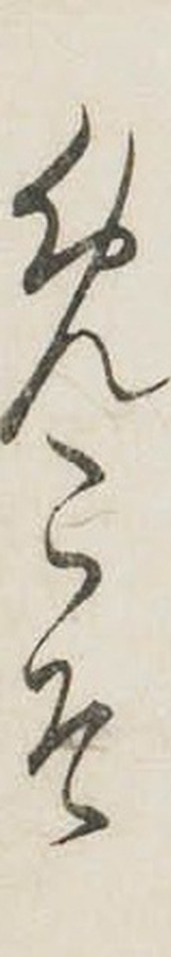めこそ
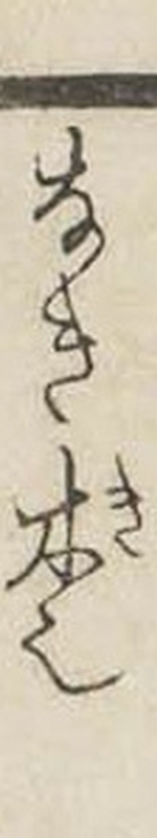なき木也
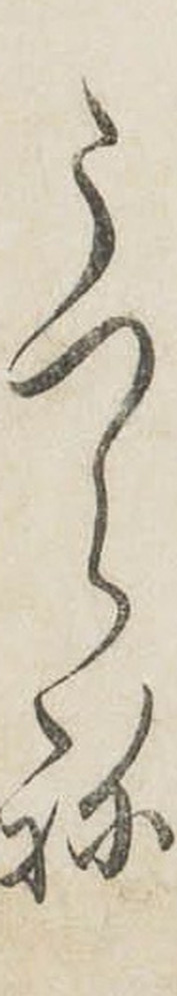うつらね

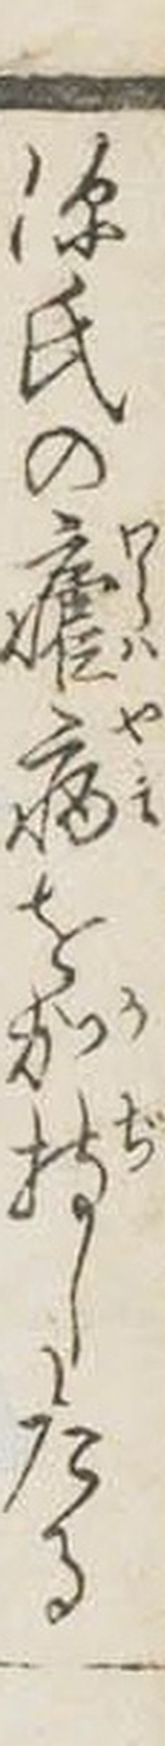源氏の瘧病を加持したる
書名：源氏百人一首
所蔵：東京学芸大学教育コンテンツアーカイブ
